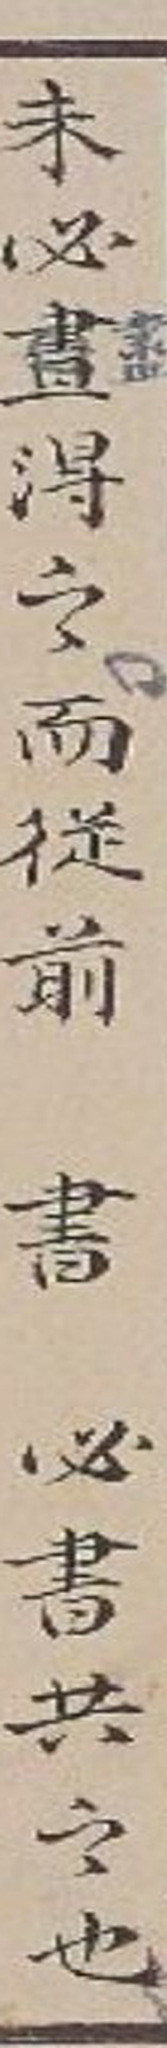未必晝尽淂之。而従前書必書共之也。
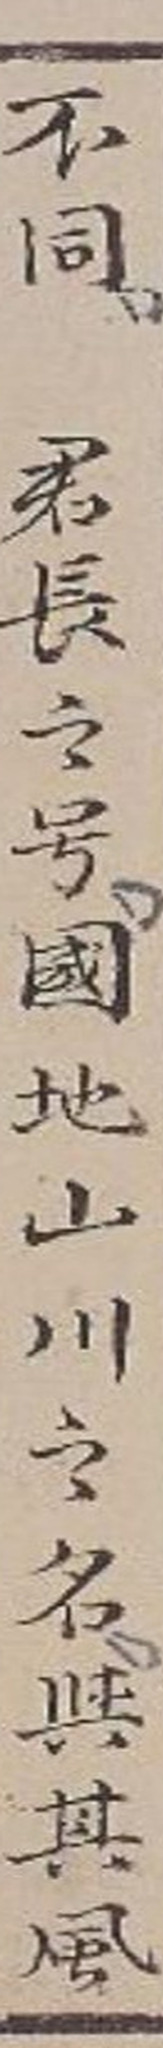不同。君長之号。国地山川之名。与其風

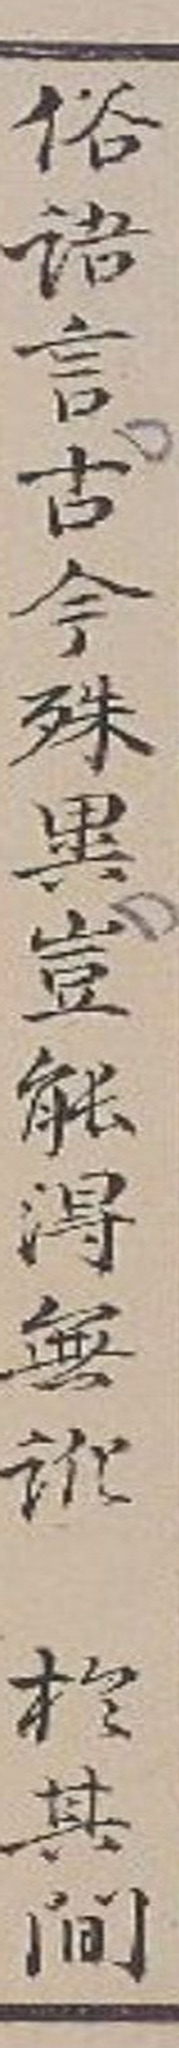俗語言。古今殊異。豈能淂無訛於其間
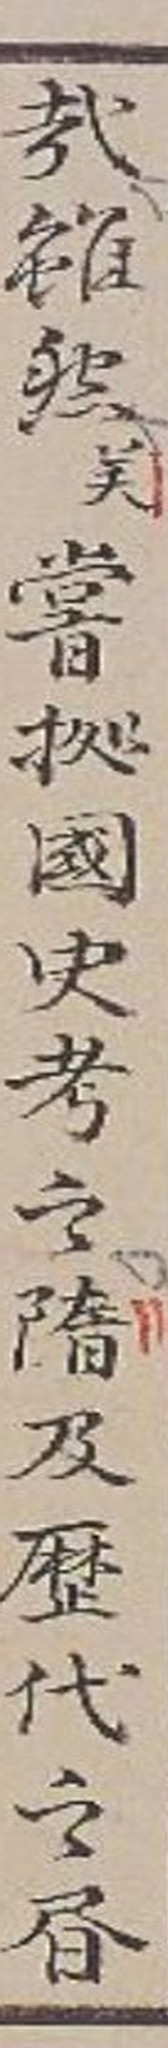哉。雖然美嘗拠国史考之隋及歴代之
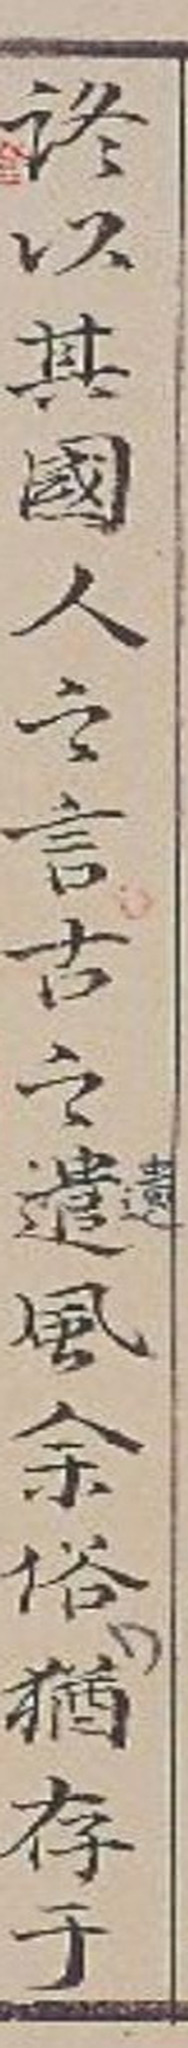詻証以其国人之言。古之遣遺風余俗。猶存于
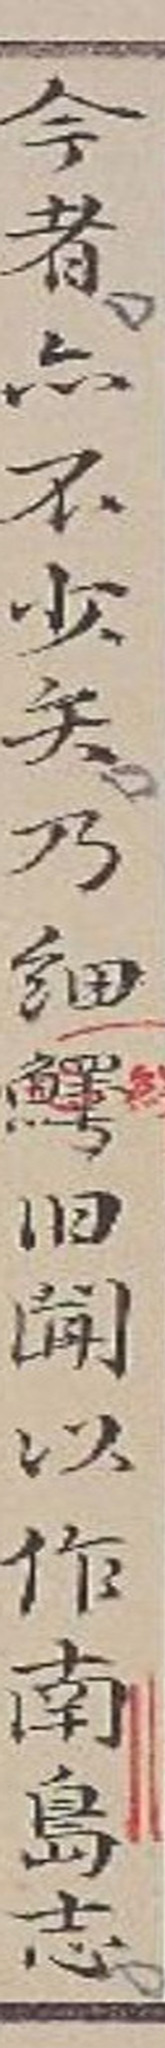今者。亦不少矣。乃細鰐繹旧聞以作南島志。
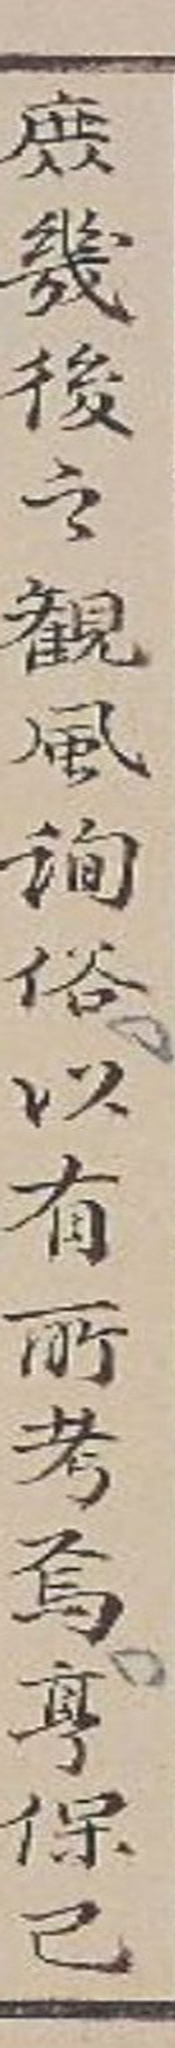庶幾後之観風詢俗。以有所考焉。享保己
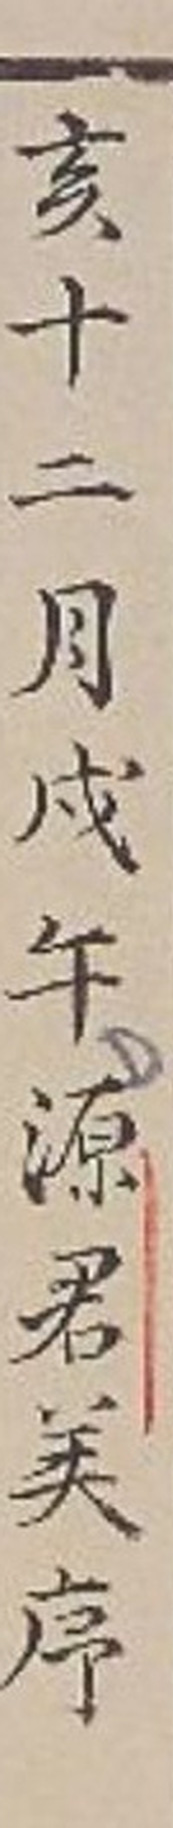亥十二月戍午。源君美序。
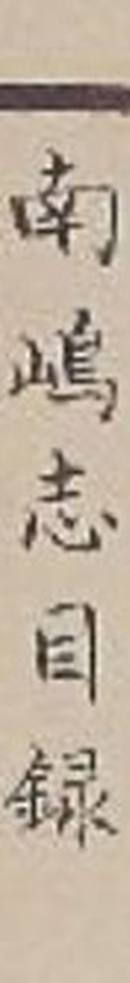南島志目録
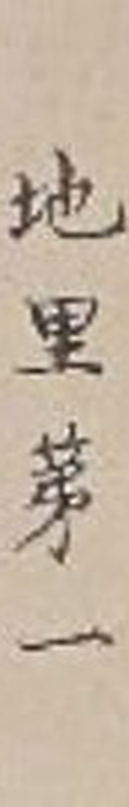地理第一
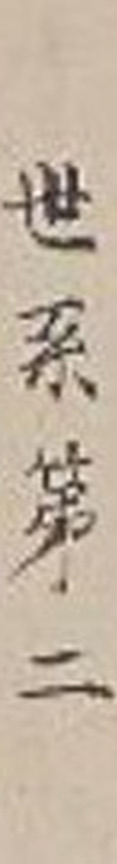世系第二
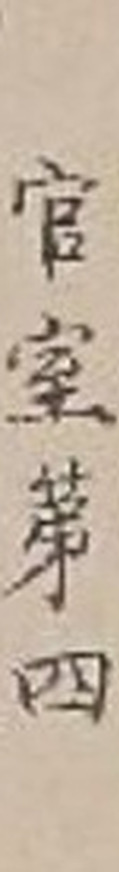官室第四
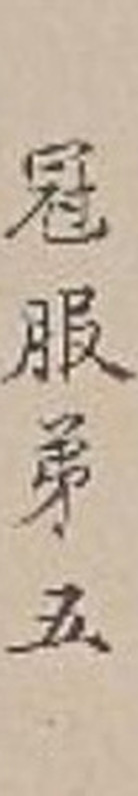冠服第五
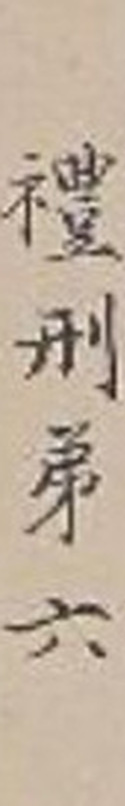礼刑第六
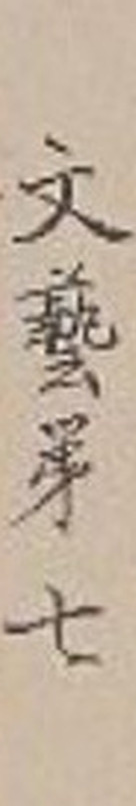文芸第七
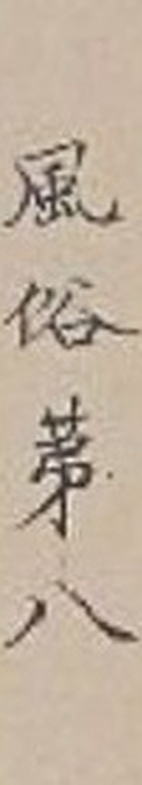風俗第八
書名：南島志 全
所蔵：University of the Ryukyus Library
